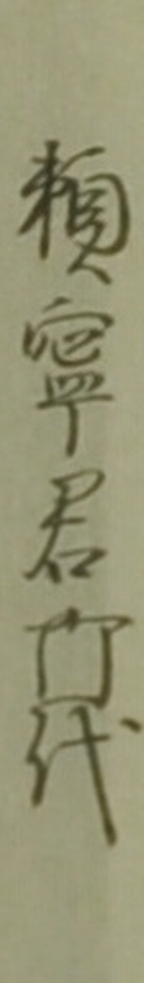頼寧君御代
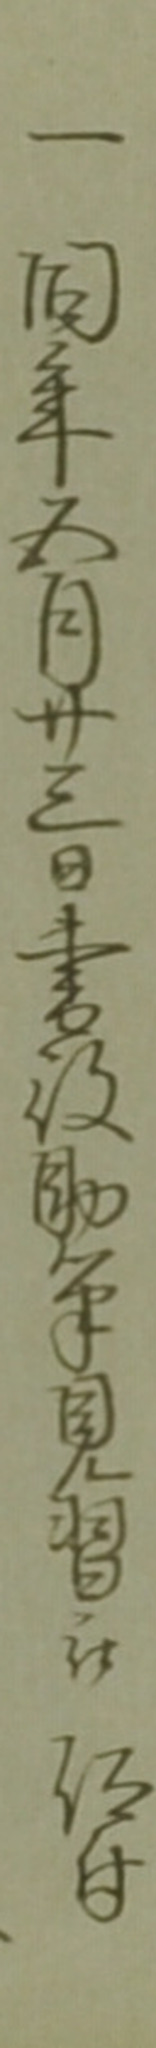一同年五月廿三日書役助筆見習被仰付
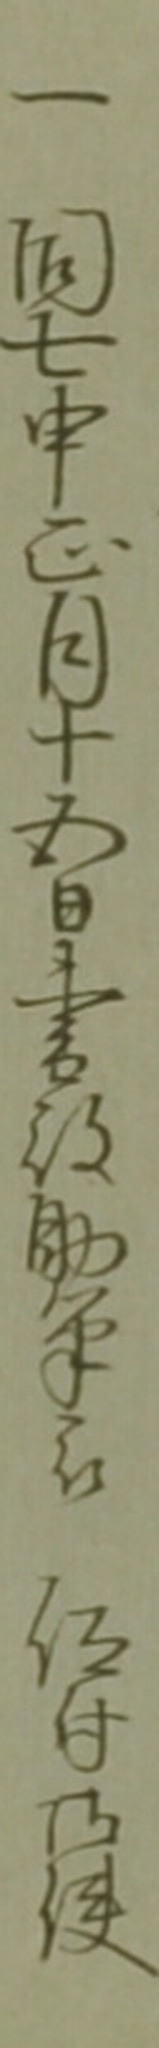一同七申正月十五日書役助筆被仰付御使
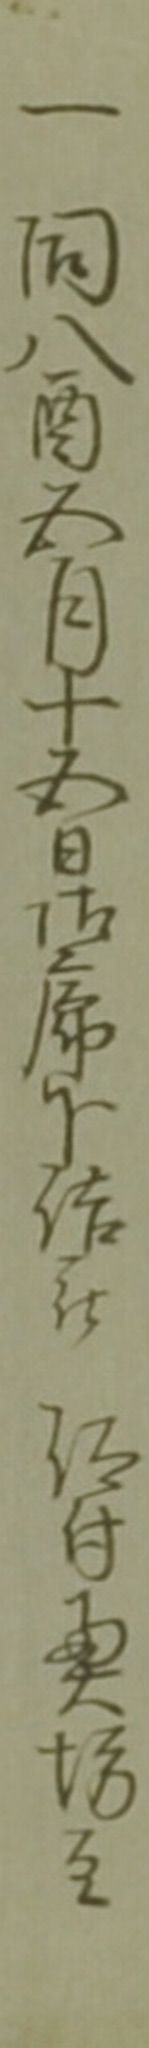一同八酉五月十五日御廊下詰被仰付奥坊主
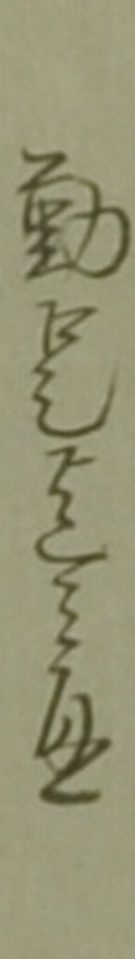勤是迄之通
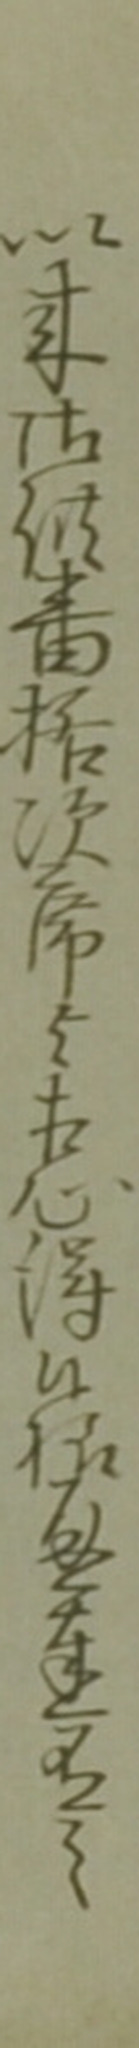以来御供番格次席与相心得候様通達有之
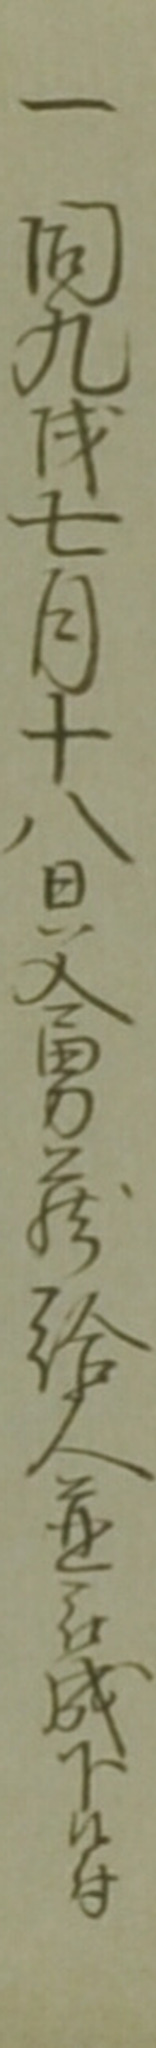一同九戌七月十八日父勇蔵給人並被成下候付
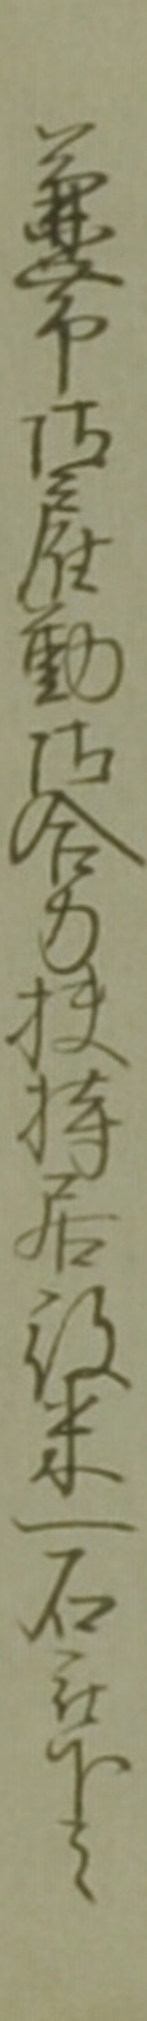兼帯御雇勤御合力扶持居役米一石被下之
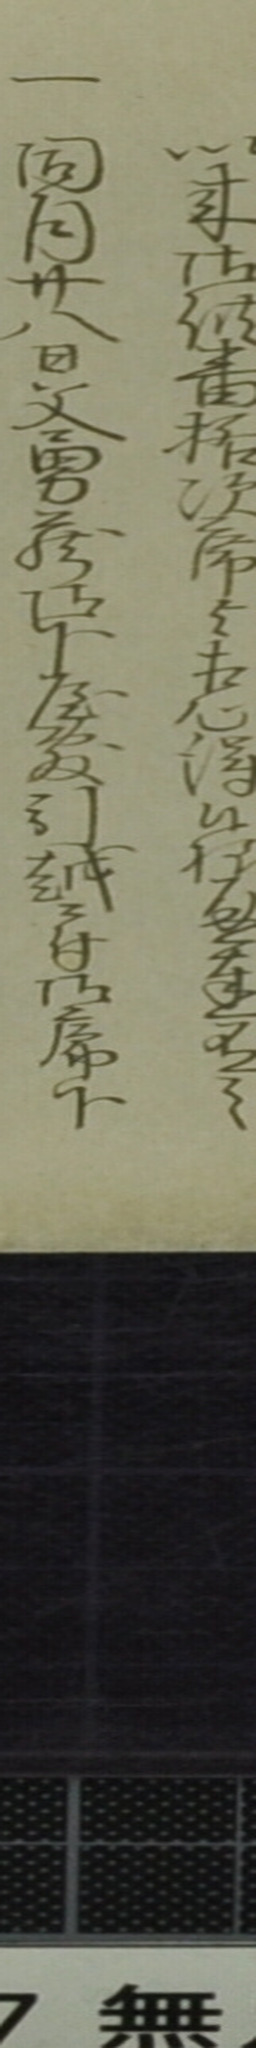一同月廿八日父勇蔵御下屋敷引越ニ付御廊下
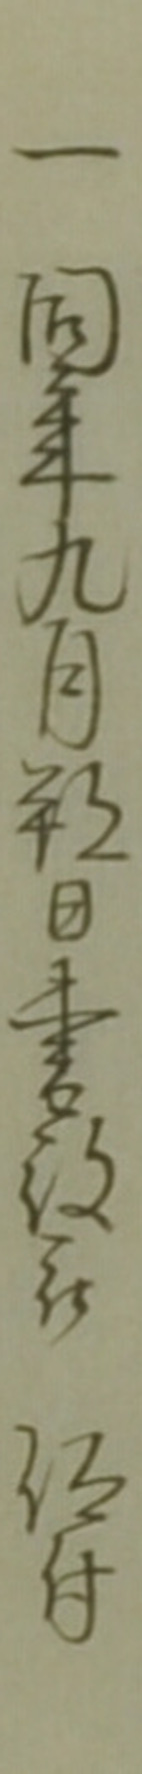一同年九月朔日書役被仰付
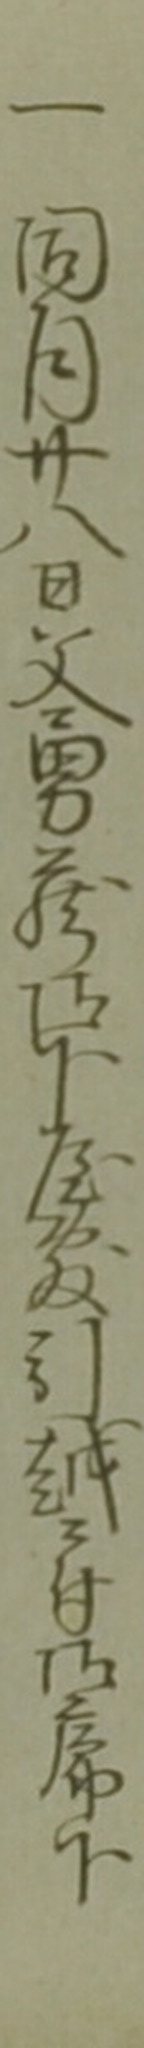一同月廿八日父勇蔵御下屋敷引越ニ付御廊下
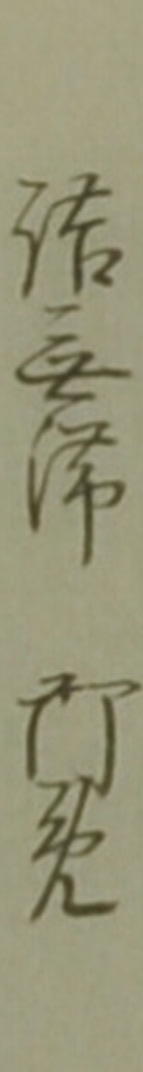詰無滞御免
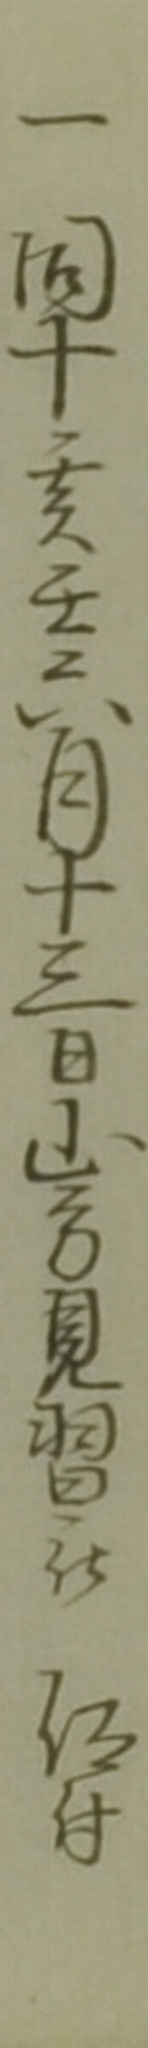一同十亥閏六月十三日山方見習被仰付
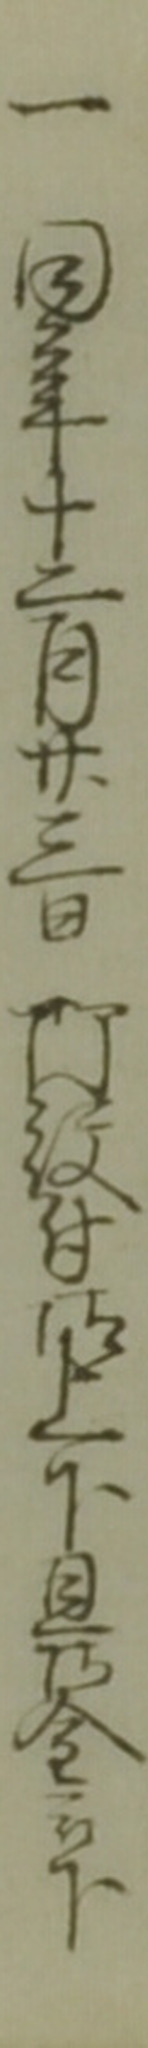一同年十二月廿三日御紋付御上下且御金被下
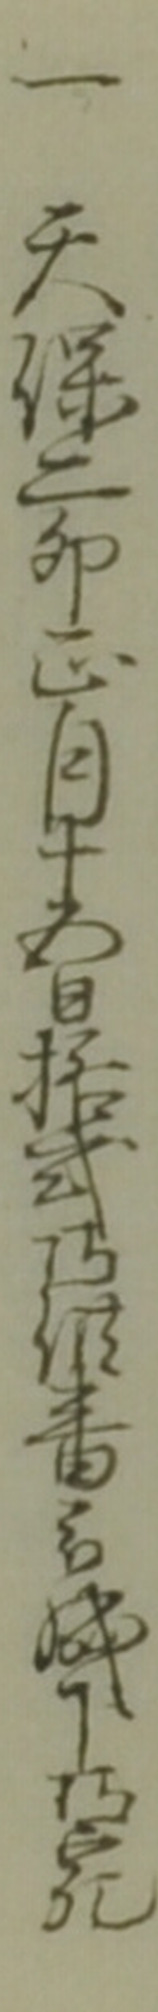一天保二卯正月十五日格式御供番被成下御宛
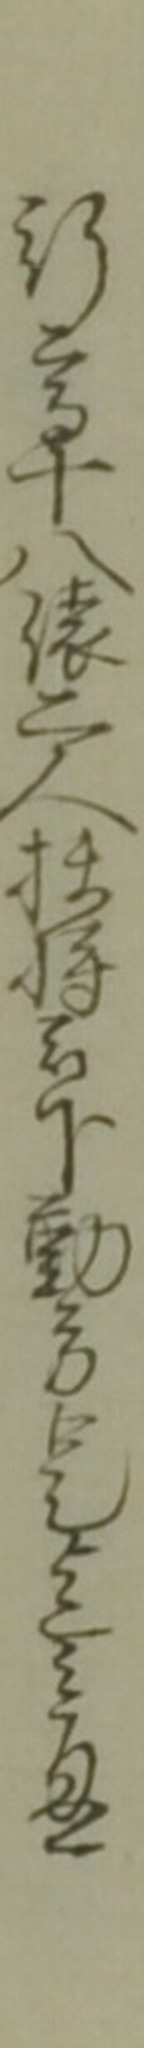行高十八俵二人扶持被下勤方是迄之通
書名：無足諸士勤仕録（一）
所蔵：伊那市立高遠町図書館・合同会社AMANE
